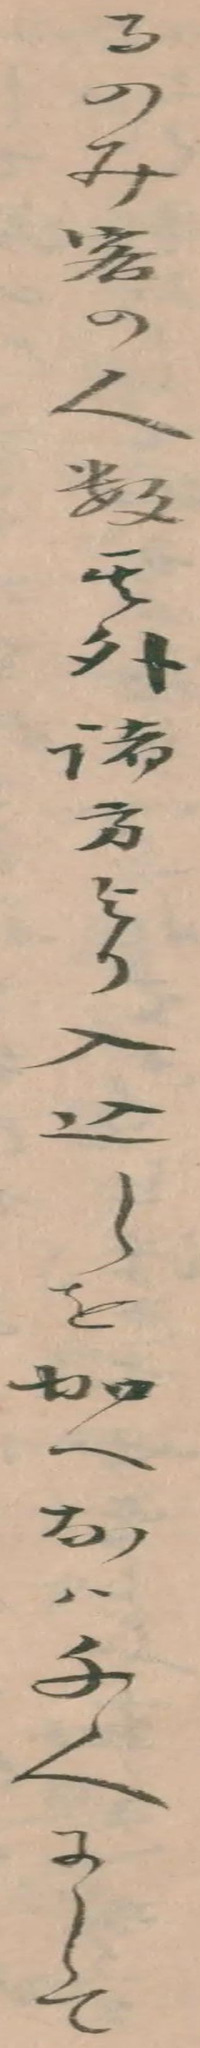るのみ客の人数其外諸方より入込しを加へなは千人にして
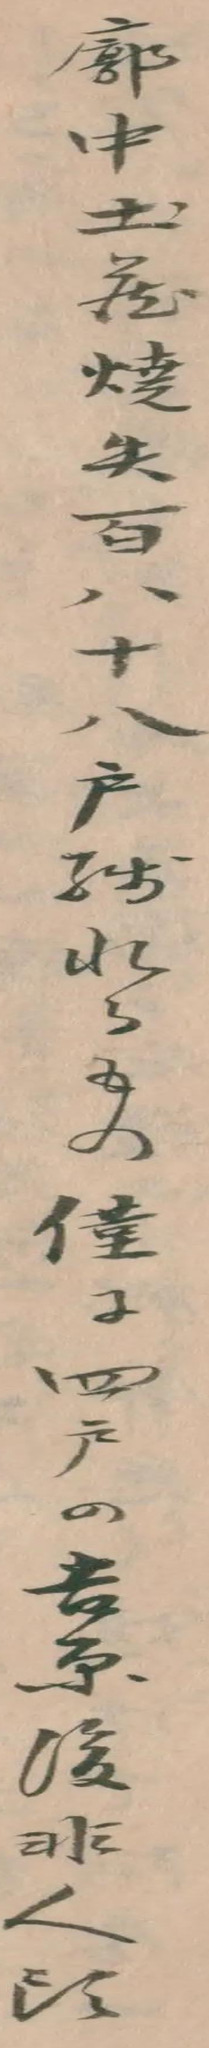廓中土蔵焼失百八十八戸残れるもの僅に四戸の吉原後非人頭

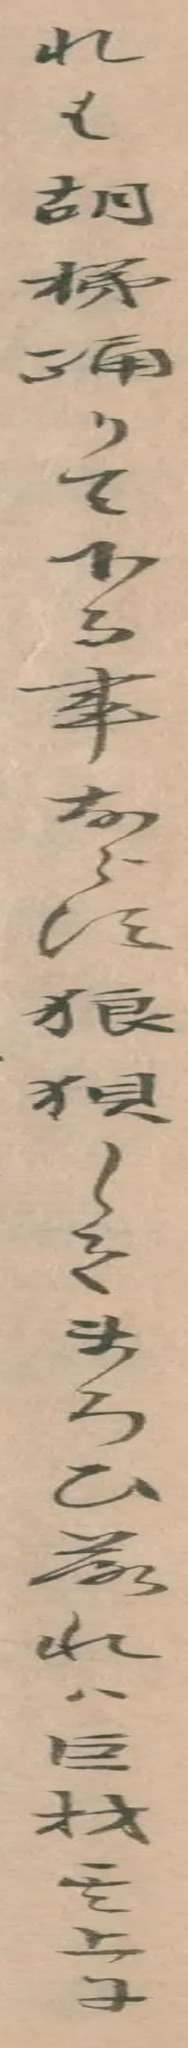れは胡梯踊りて下る事ならす狼狽してまろひ落れは巨材其上に
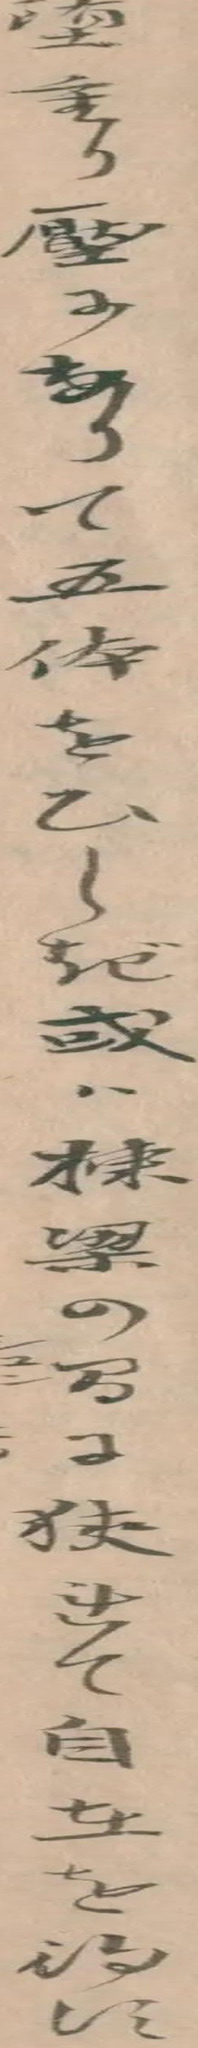堕重り壓になりて五体をひしぎ或は棟梁の間に挟れて自在を得す
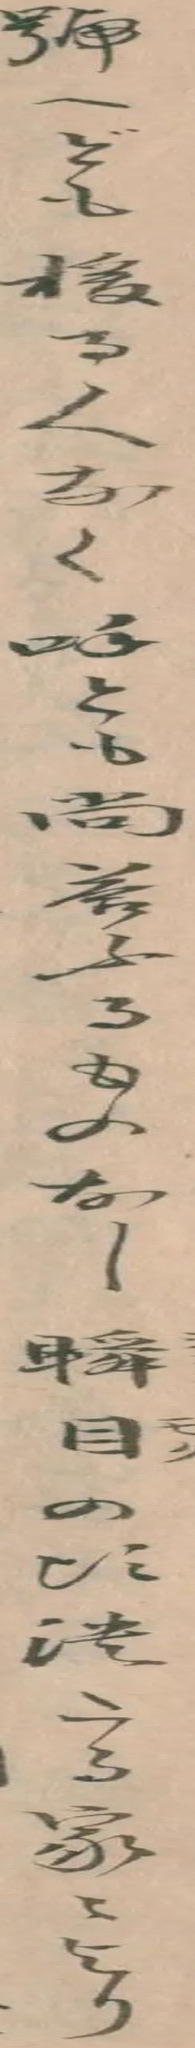號へども援る人なく呼とも尚答ふるものなし瞬目の頃潰たる家々より
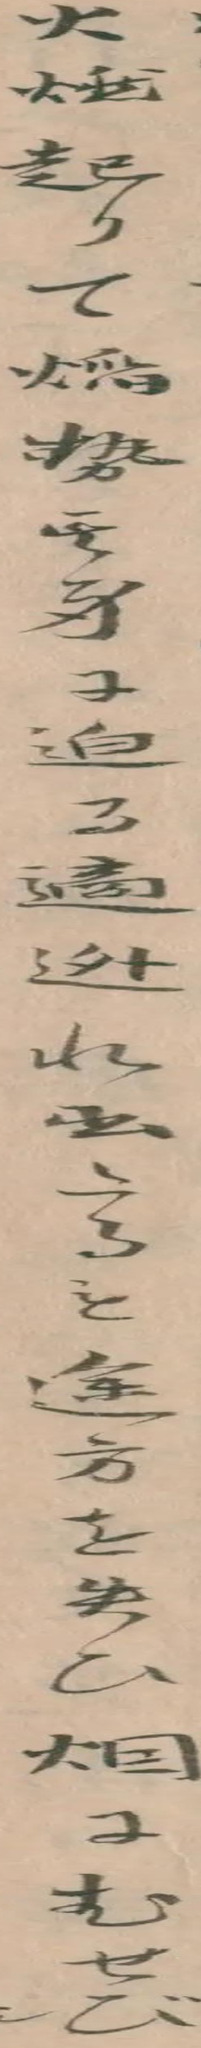火燃起りて焔勢其身に迫る適迯れ出たるも途方を失ひ烟にむせび
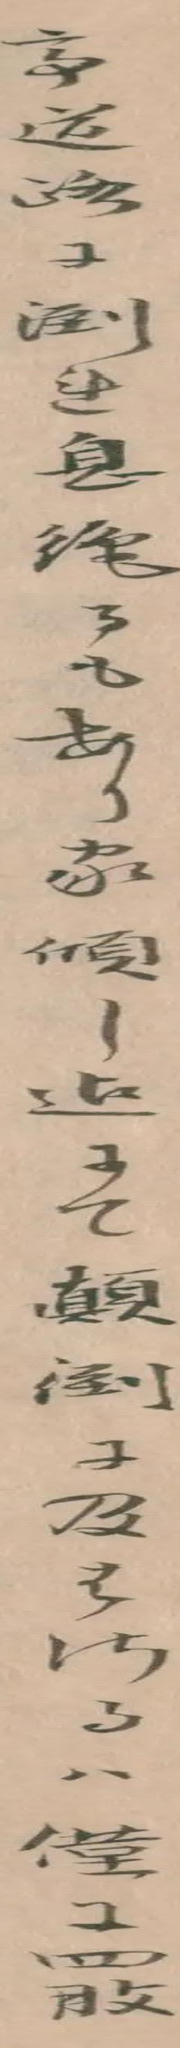て道路に倒れ息絶るもあり家傾し迄にて顛倒に及はさるは僅に四肢
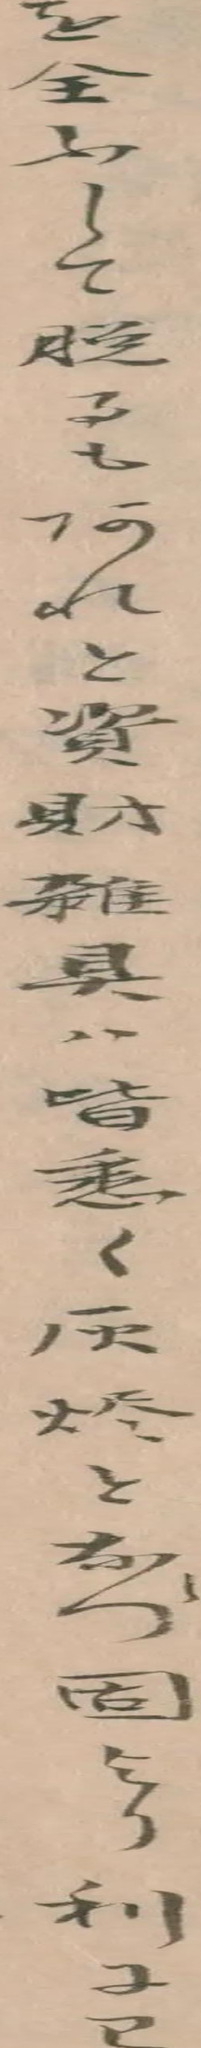を全ふして脱るもあれと資財雑具は皆悉く灰烬となしつ固より利にわ
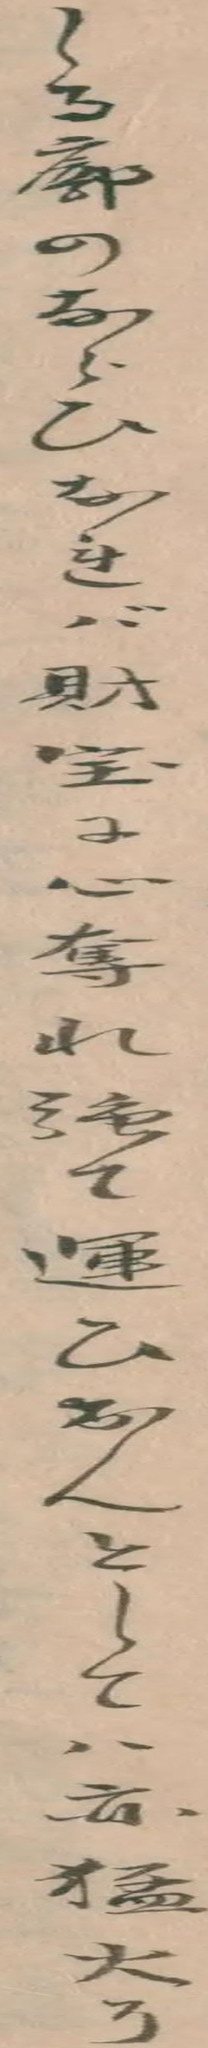しる廓のならひなれば財宝に心奪れ強て運ひ出んとしては亦猛火に
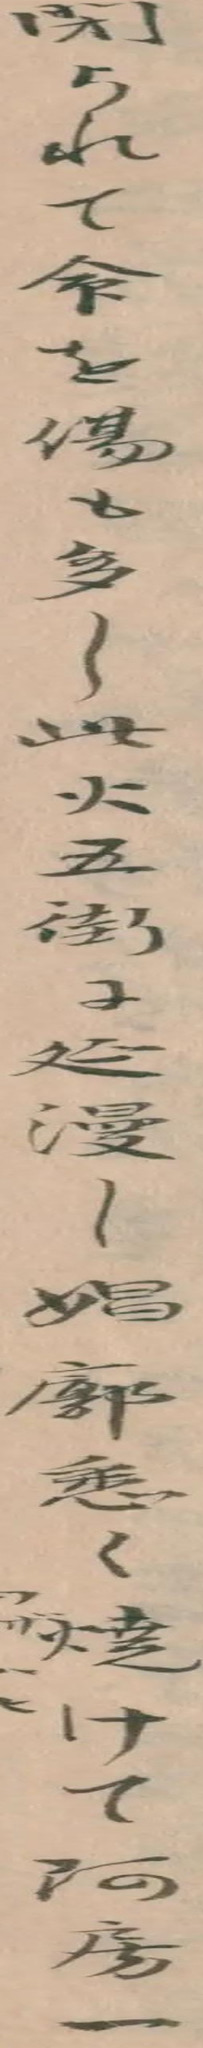閉られて命を傷も多し此火五街に延漫し娼廓悉く焼けて阿房一
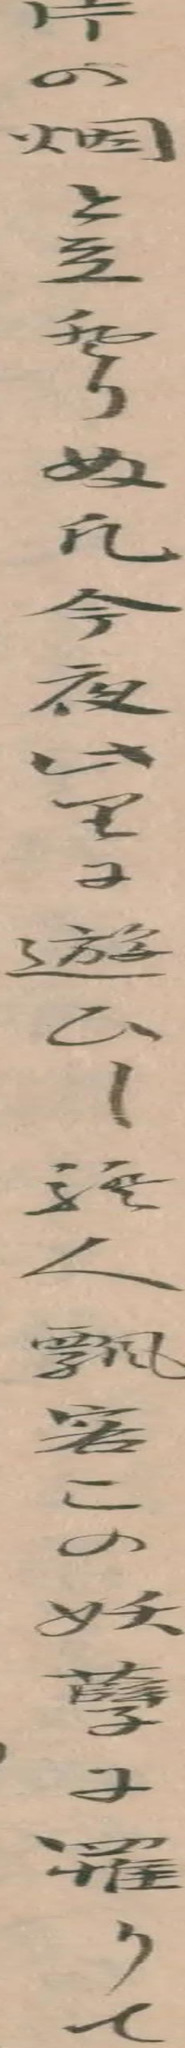片の烟と立登りぬ凡今夜此里に遊ひし騒人飄客この妖孼に罹りて
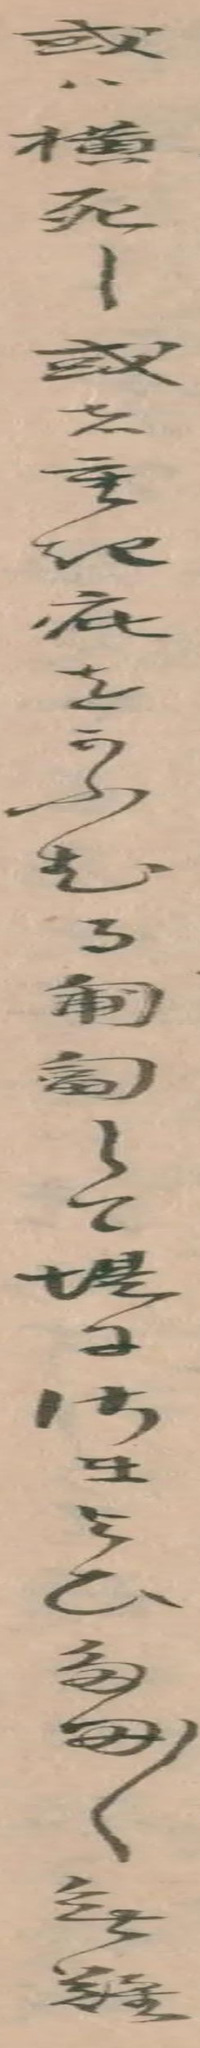或は横死し或は重き疵をかふむる匍匐して堤にさまよひたま〳〵無難
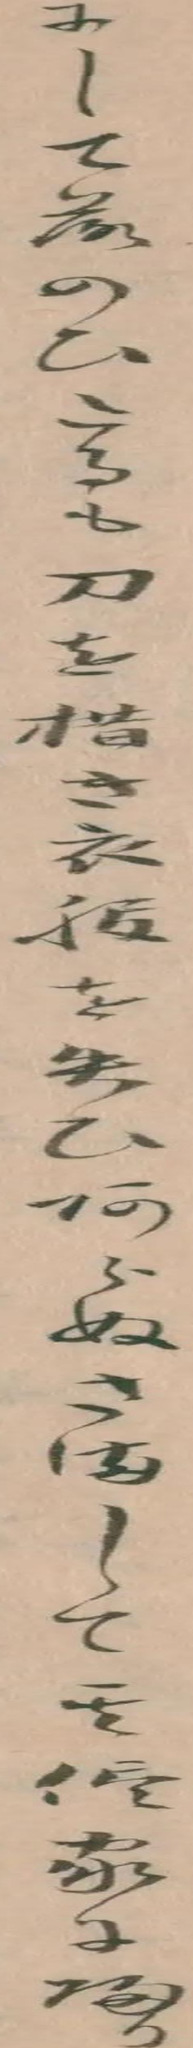にして落のひたるも刀を措き衣服を失ひあらぬさまして其侭家に帰り
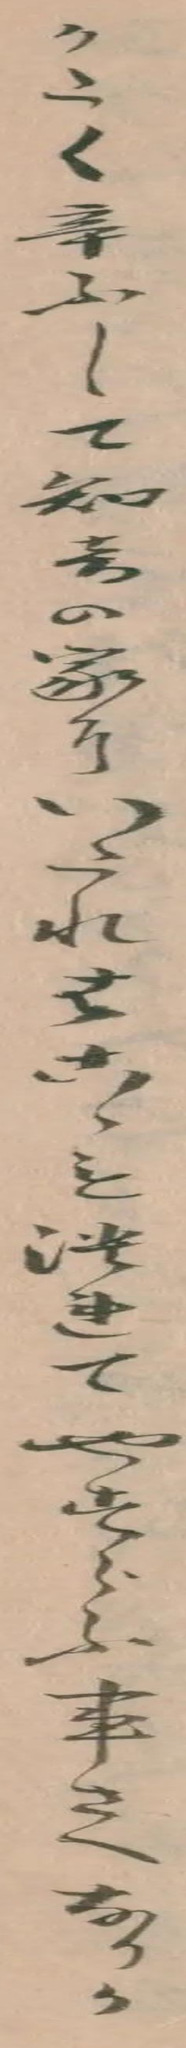かたく辛ふして知者の家にいたれはこゝも潰れてやすらふ事さへなりか
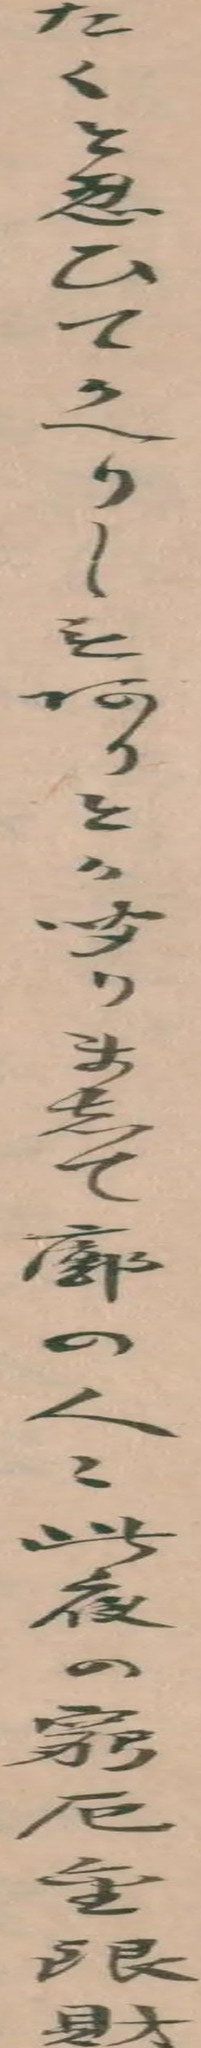たくと忍ひてかへりしもありとか聞りまして廓の人々此夜の窮厄金銀財
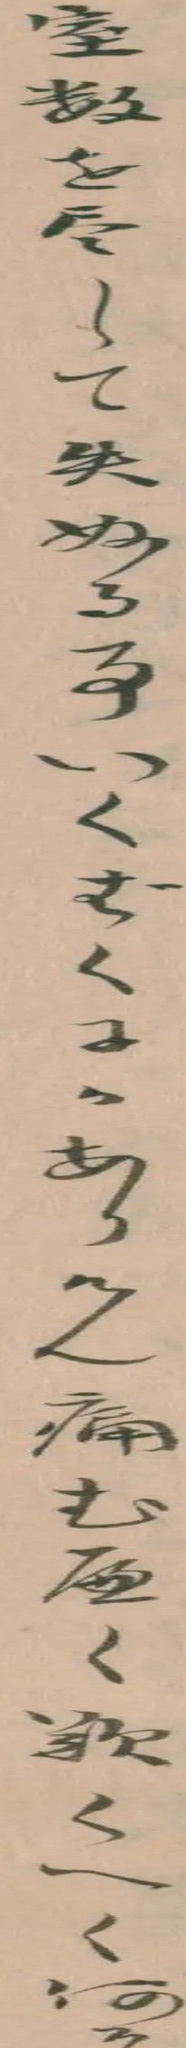宝数を尽して失ぬる事いくばくにかありけん痛むへく歎くへく何そ
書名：地災撮要. 巻7-9(地震之部)
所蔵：国立国会図書館 National Diet Library, JAPAN
